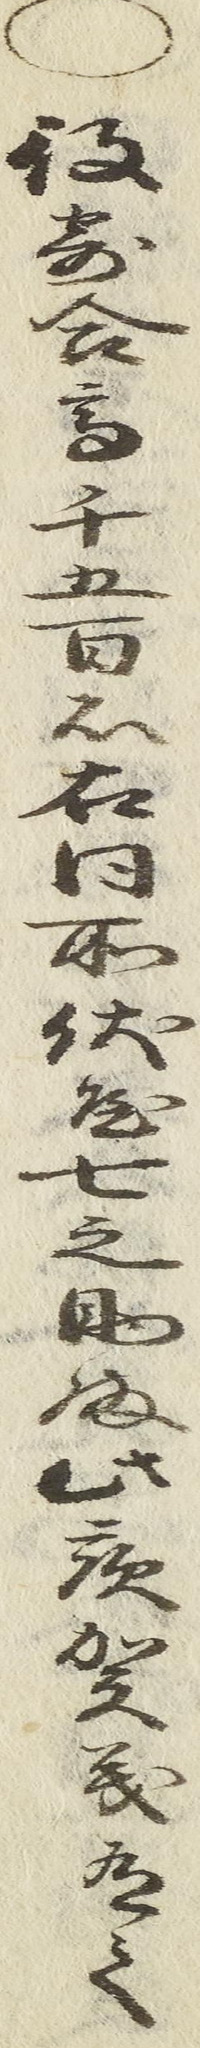○役寄合高千五百石右同所伏屋七之助殿此夜賀義有て
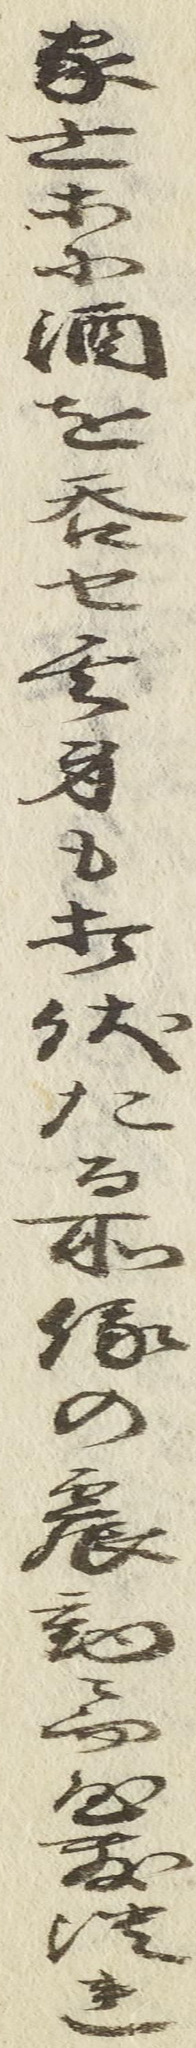家士等に酒を呑せ其身も打伏たる所俄の震動ニ而屋敷潰れ
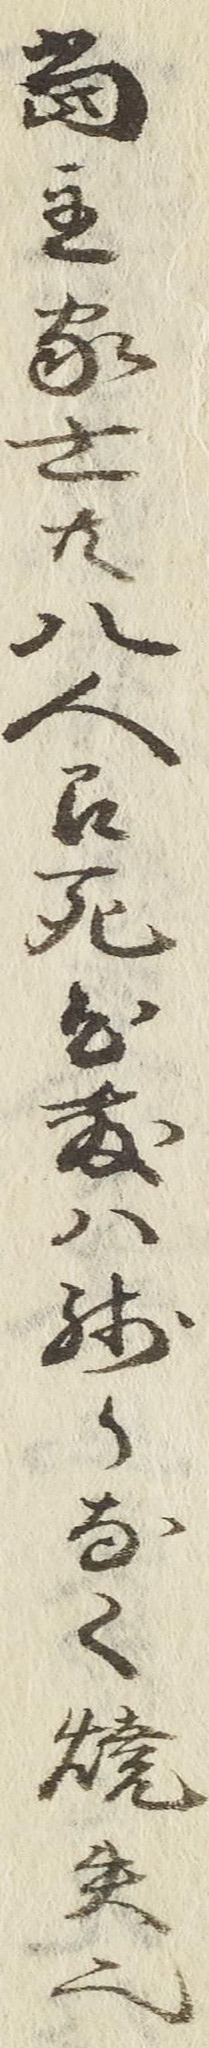当主家士共八人即死屋敷は残りなく焼失也
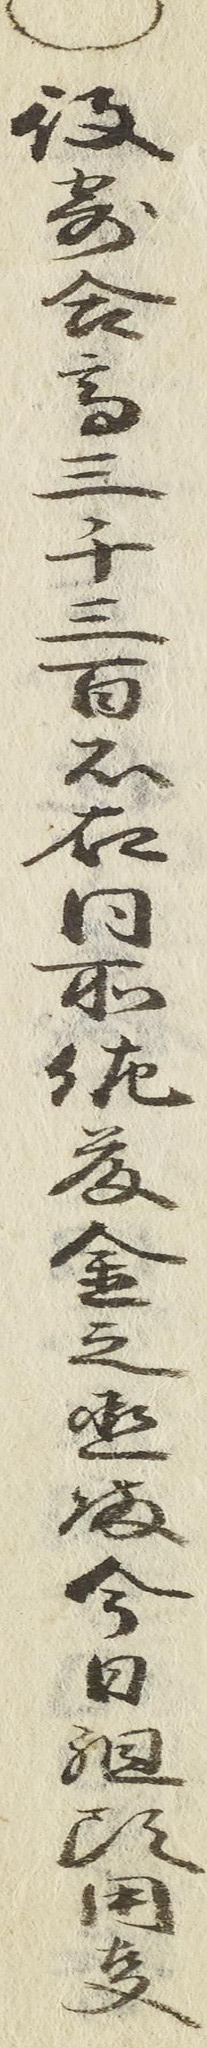○役寄合高三千三百石右同所佐藤金之丞殿今日組頭用事
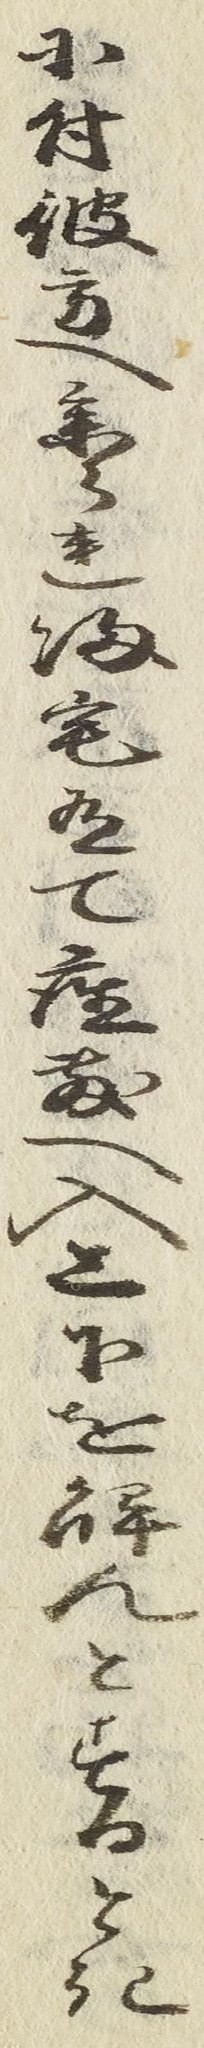に付彼方へ参られ帰宅有て座敷へ入上下を解んとするとき
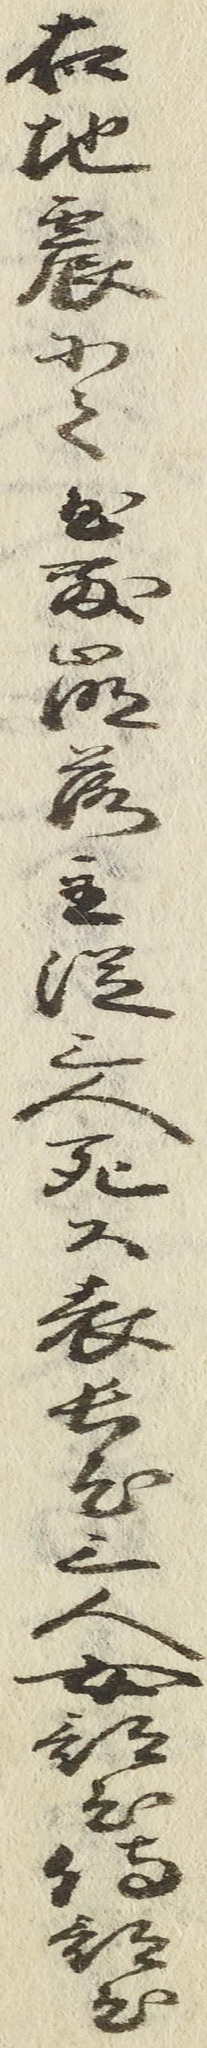右地震にて屋敷崩落主従三人死ス表長屋三人女部屋侍部屋
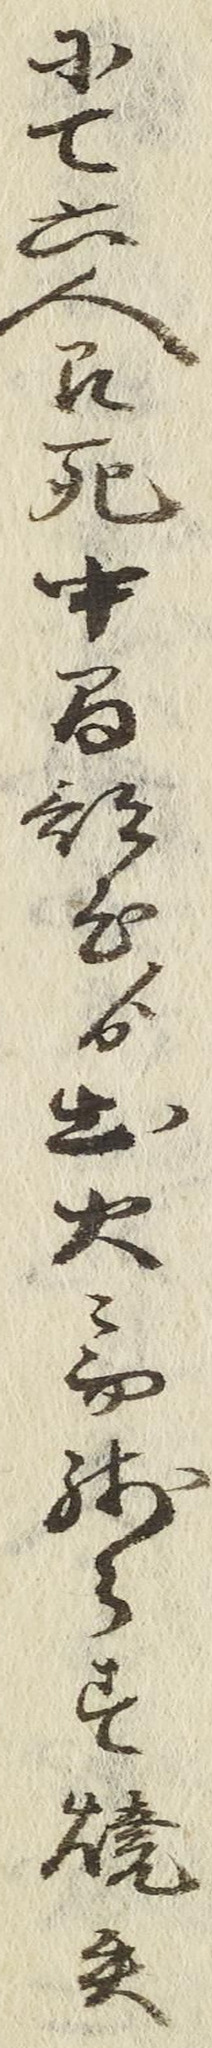にて六人即死中間部屋ゟ出火ニ而残らす焼失
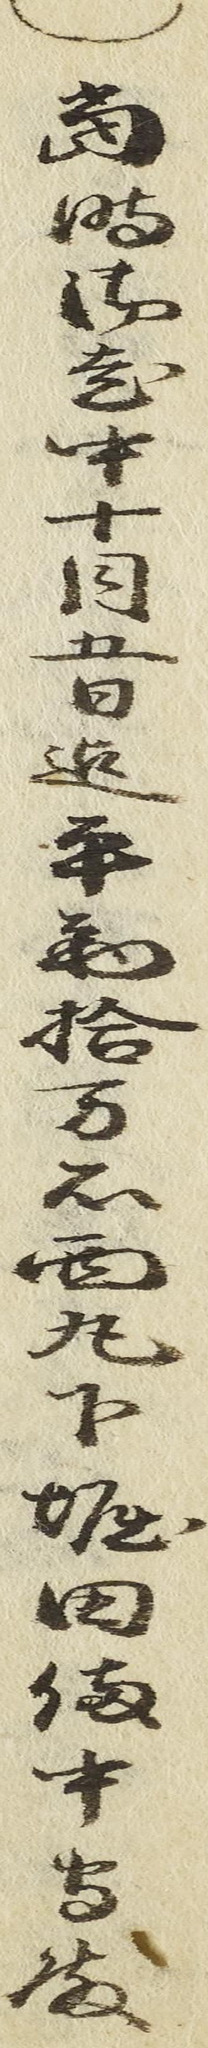○当時御老中十月五日迄平勤拾万石西丸下堀田備中守殿
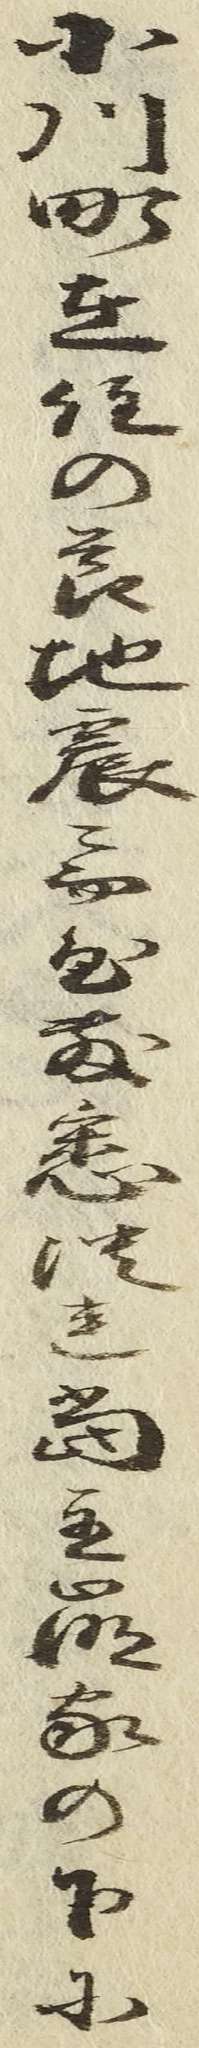小川町在住の節地震ニ而屋敷悉潰れ当主崩家の下に
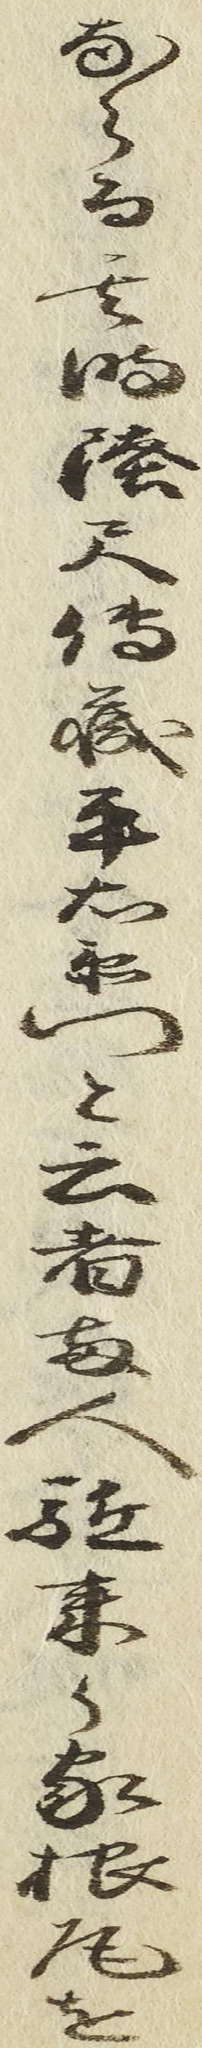ならる其時陸尺伝蔵平右衛門と云者両人駈来り家根瓦を
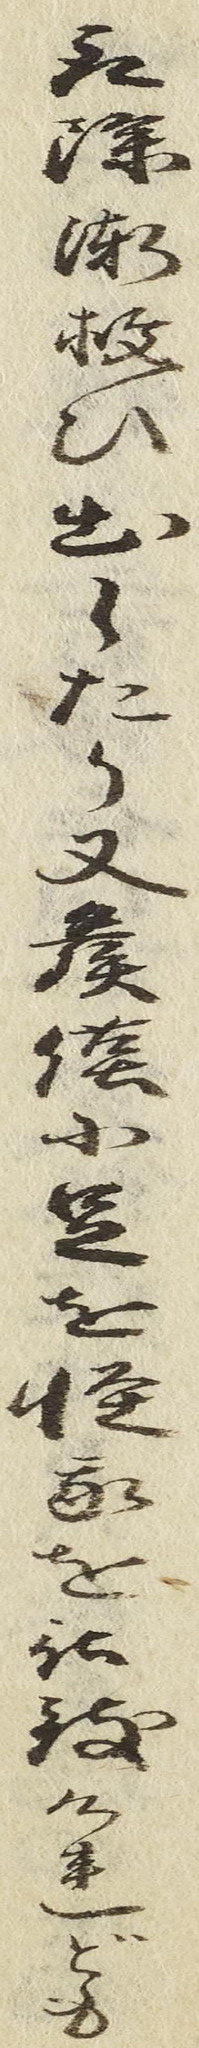取除漸救ひ出したり又侯僅に足を怪我を被致けれども
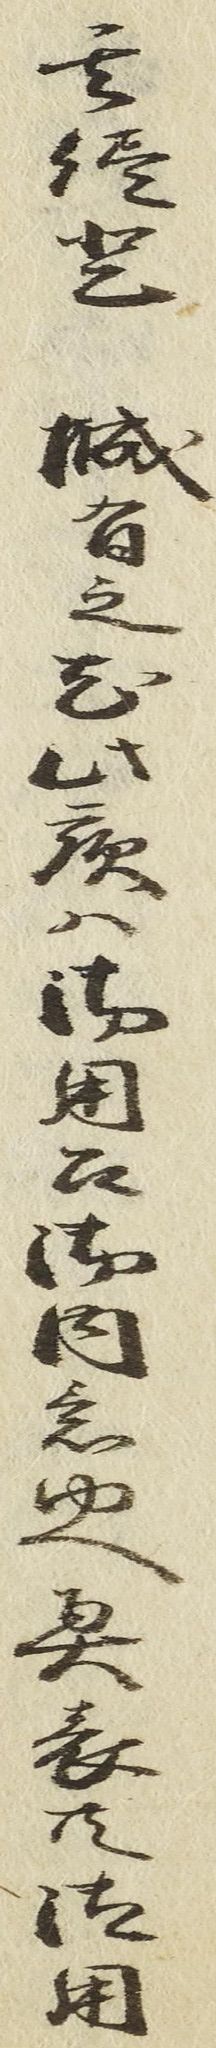其侭登城有之尤此夜は御用召御内意ゆへ奥表共御用
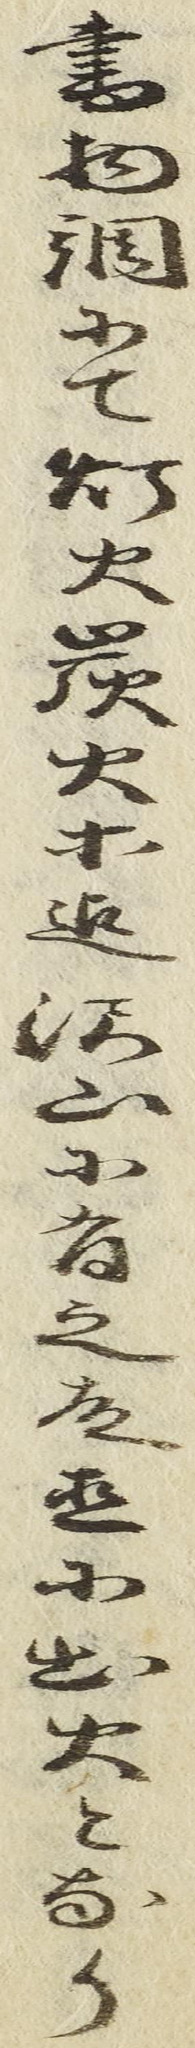書物調にて灯火炭火等迄沢山に有之故直に出火となり
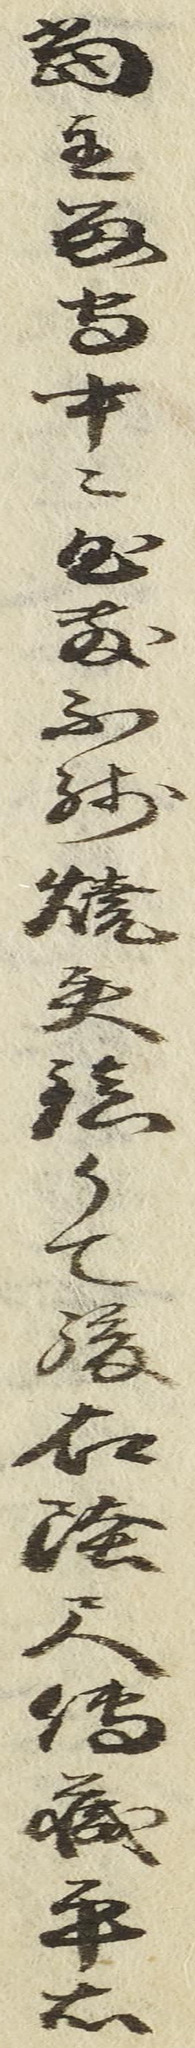当主留守中ニ屋敷不残焼失鎮りて後右陸尺伝蔵平右
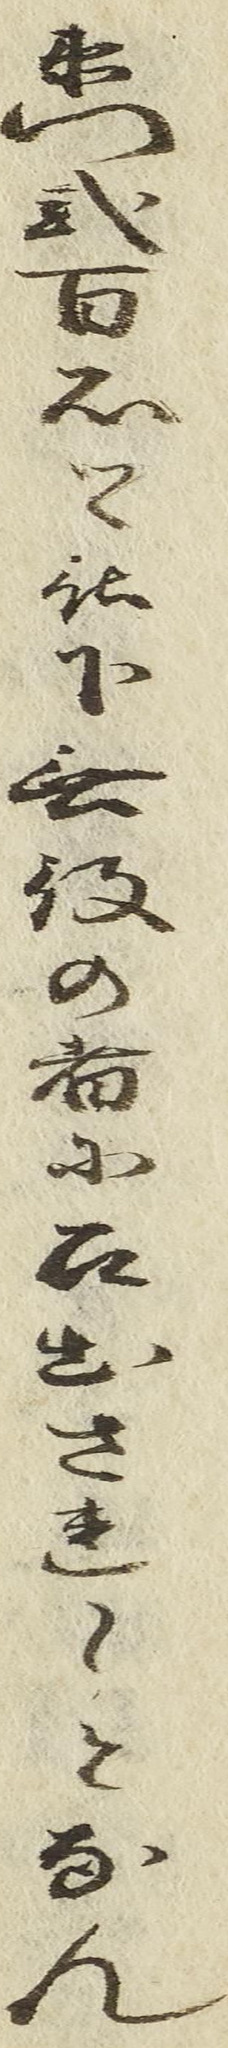衛門弐百石ツヽ被下無役の者に召出されしとなん
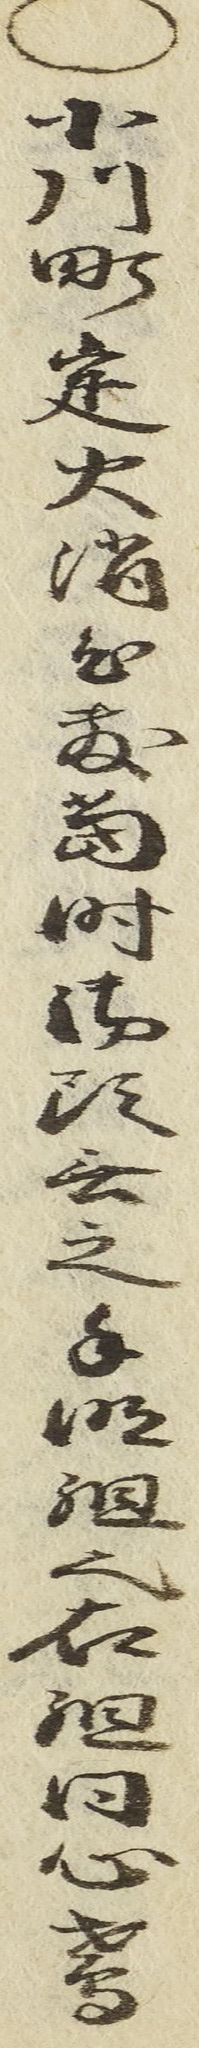○小川町定火消屋敷当時御頭無之手明組也右組同心鳶
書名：安政二年震災記事　完
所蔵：東京大学地震研究所図書室 Earthquake Research Institute Library, The University of Tokyo, JAPAN
